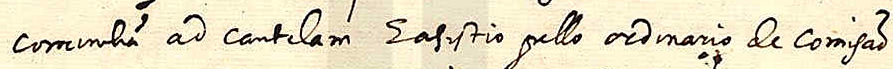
cominhā ad cautelam E asistio pello ordinario de comisaõ
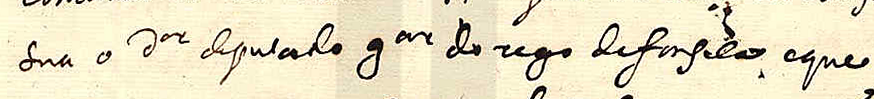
sua o dor deputado gar do rego de fonseca, e que
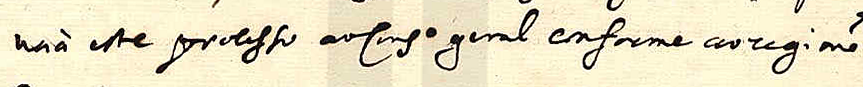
uaà este processo ao Conso geral conforme ao regimē
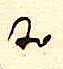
to
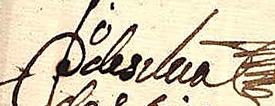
Po de silua
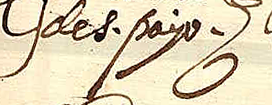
de s. payo.
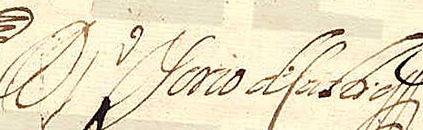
Dio Osorio de Castro
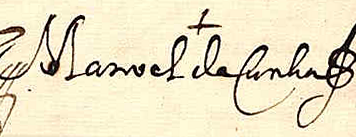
Manoel da Cunha
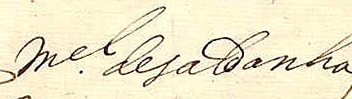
M.el de saldanha
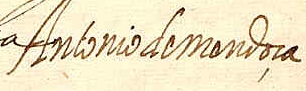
Antonio de mendoça
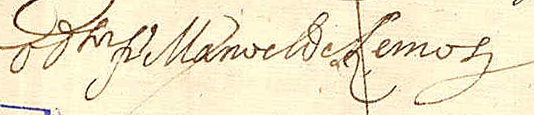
o dtor fr̄ Manoel de Lemos
